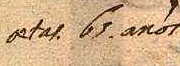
ætas. 65. anōs
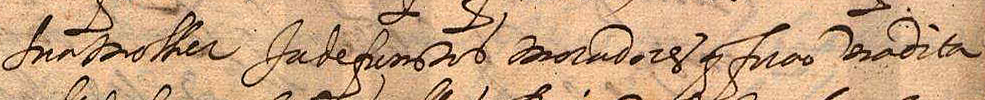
sua molher Ja defunctos moradores q̄ foraõ na dita
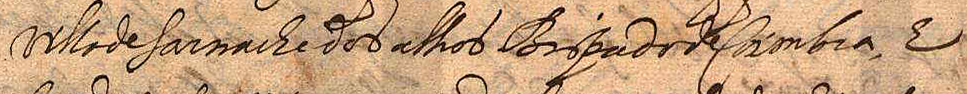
villa de Sarnache dos alhos Bispado de Coimbra, E
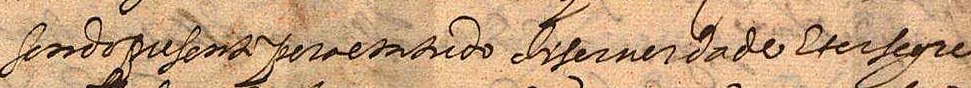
sendo presente pera em tudo diser uerdade E ter segre
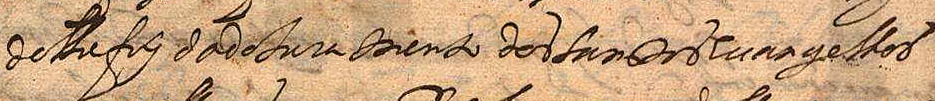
de lhe foy dado Iuramento dos sanctos Euangelhos
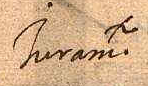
Iuram.to
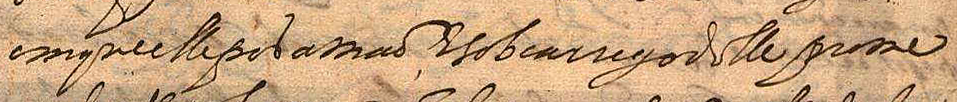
em que elle pos a maõ, E sob carrego delle prome
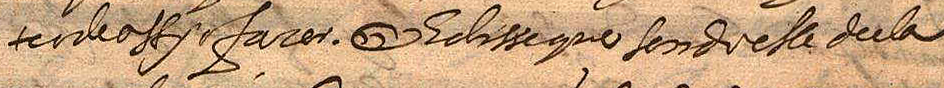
teo de assy o fazer. ⁋ E disse que sendo elle decla
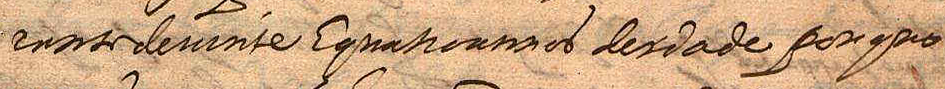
rante de uinte E quatro annos de idade pouquo
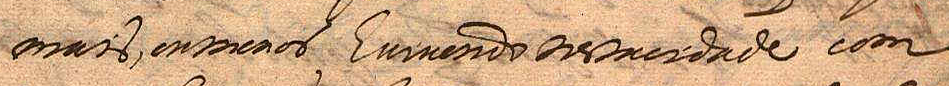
mais, ou menos, E uiuendo nesta cidade com
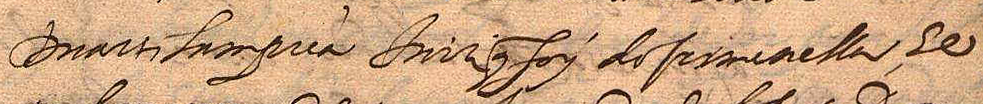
Duarte Lamprea Iuiz q̄ foy do Crime nella, se
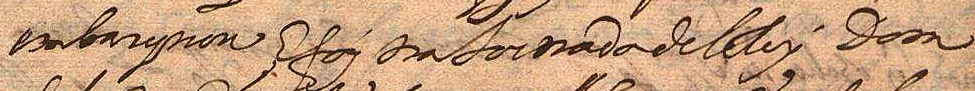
embarquou E foy na Iornada del Rey Dom
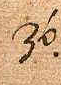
3o.
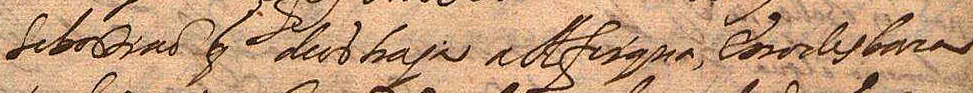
sebastiaõ q̄ deos haja a Afriqua, e no desbara
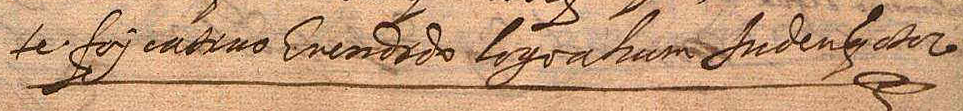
te foy catiuo E uendido logo a hum Judeu q̄ o tor
